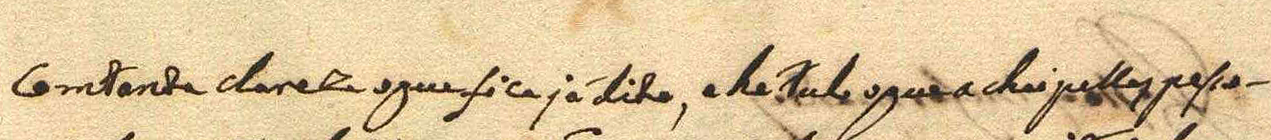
Com tanta clareza o que fica já dito, e he tudo o que achei pellas pesso
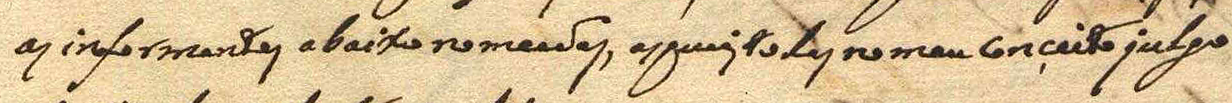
as informantes abaixo nomeadas, as quais todas no meu conçeito julgo
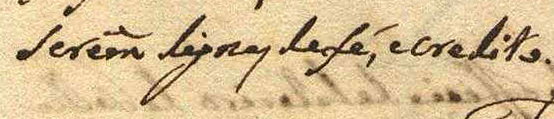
serem dignas da fé, e credito.
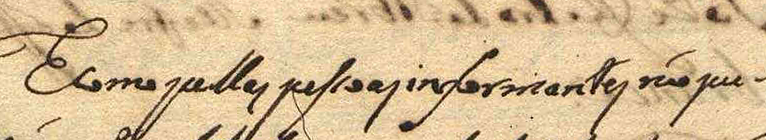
E como pellas pessoas informantes naõ pu
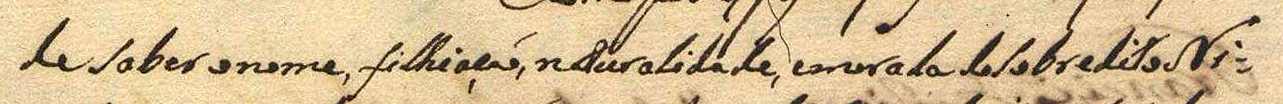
de saber o nome, filhiaçaõ, naturalidade, e morada do sobredito Ni
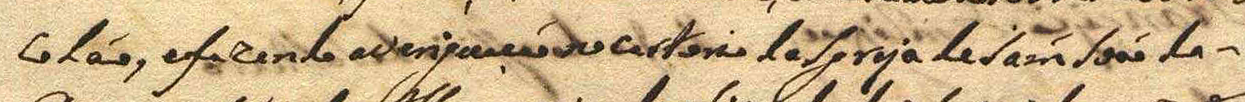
CoLáo, e fazendo averiguaçaõ no cartorio da Igreja de Sam̄ Ioaõ da
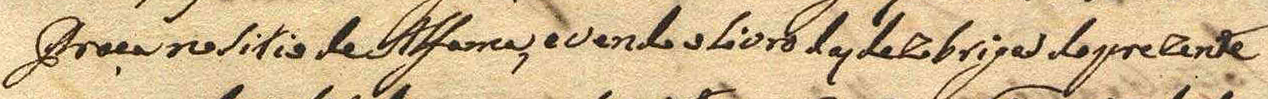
Praça no sitio de Alfama, e vendo o Livro das dezobrigas do prezente
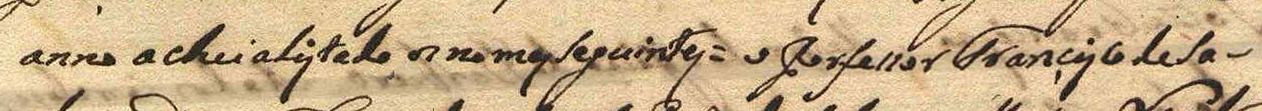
anno achei alistado os nomes seguintes= o Porfessor Francisco de Sa
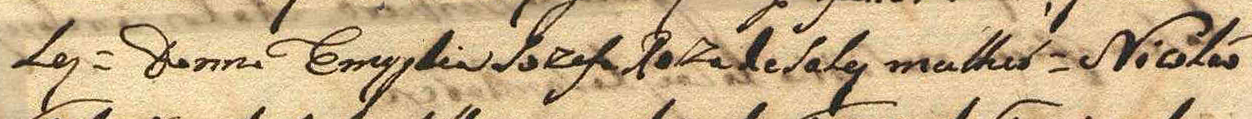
Les= Donna Emyglia Iozefa Roza de Sales mulher = Nicoláo
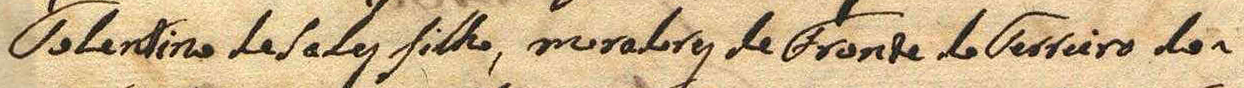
Tolentino de SaLes filho, moradores de Fronte do Terreiro do
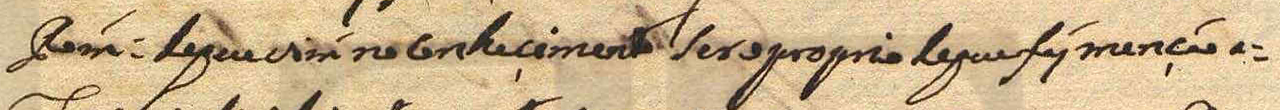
Pom̄; de que vim no conhecimento ser o proprio de que fás menção a
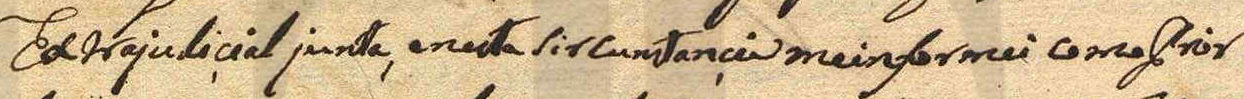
Extrajudiçial junta, e nesta sircuntançia me informei com o Prior
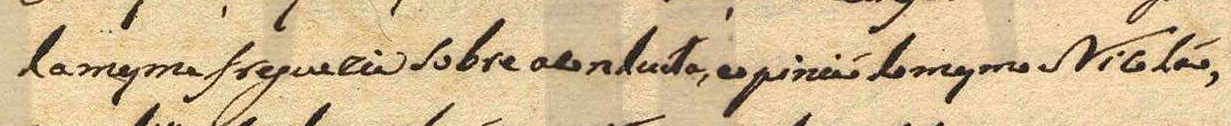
da mesma freguezia sobre a conducta, e opiniaõ do mesmo Nicoláo,
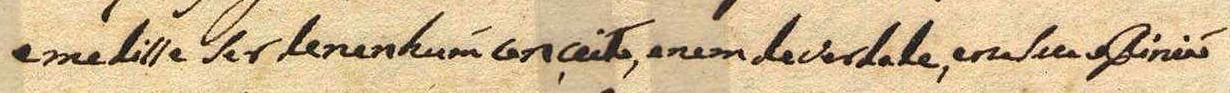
e me disse ser de nenhum̄ conçeito, e nem de verdade, e na sua oPiniaõ
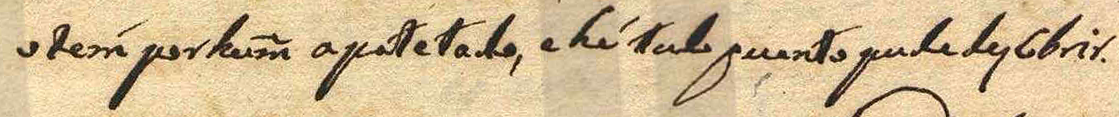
o tem̄ por hum̄ apatetado, e hé tudo quanto pude descobrir.
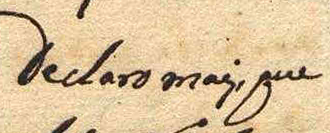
Declaro mais, que
